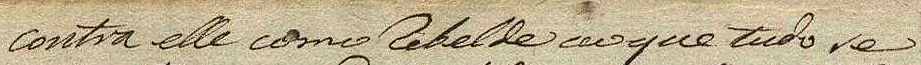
contra elle como Rebelde ao que tudo se
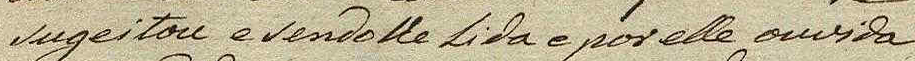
sugeitou e sendolhe lida e por elle ouvida
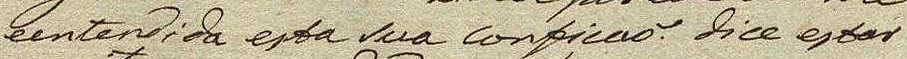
e entendida esta sua confiçaõ dice estar
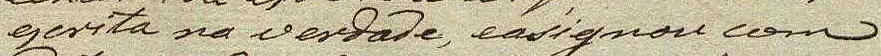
escrita na verdade, e asignou com
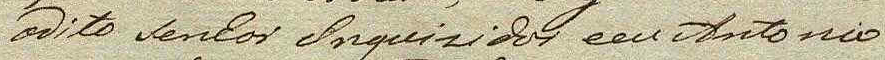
o dito senhor Inquizidor e eu Antonio
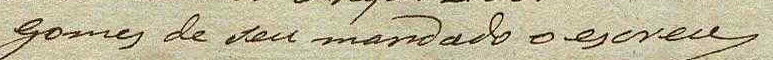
Gomes de seu mandado o escreuj.
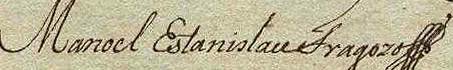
Manoel estanislauFragozo
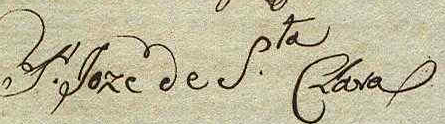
F. Joze de S.ta Clara
